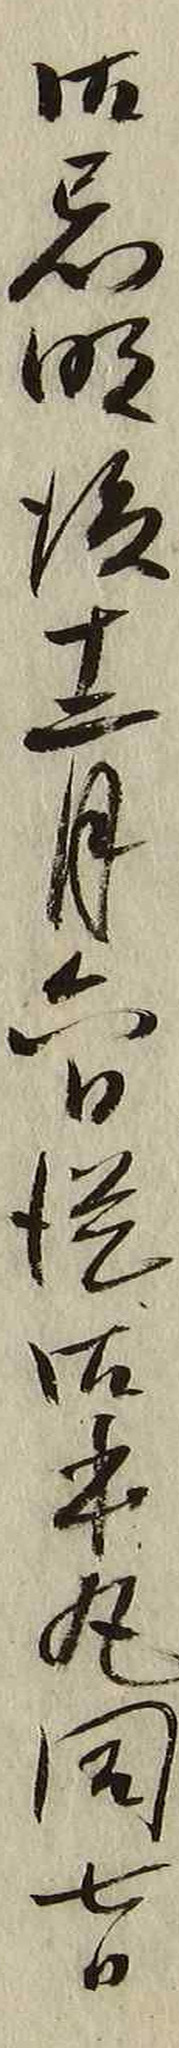御忌明後十二月六日従御本丸同七日
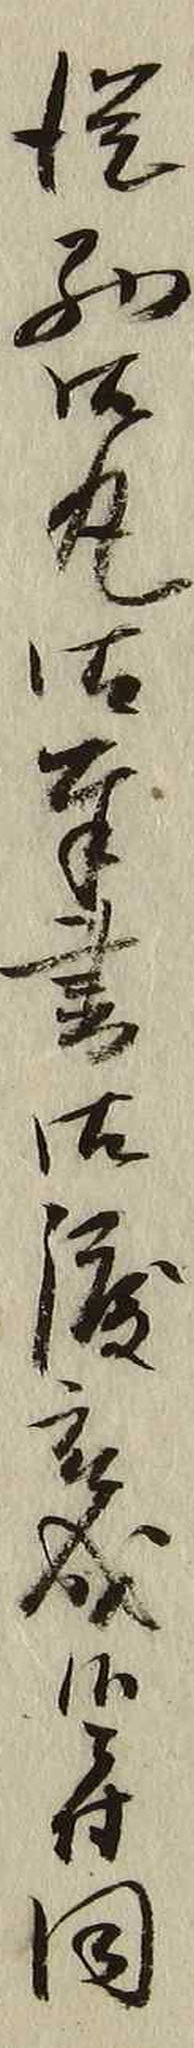従西御丸御奉書御渡被成候ニ付同
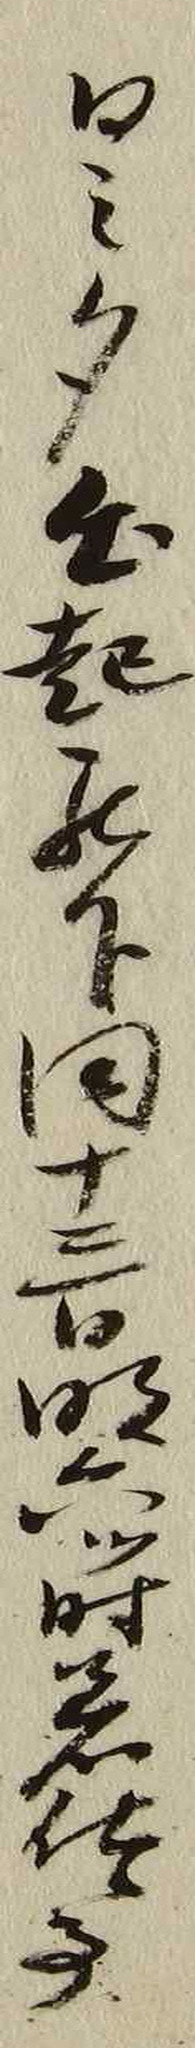日之夕出起罷下同十三日明六ツ時着仕候事
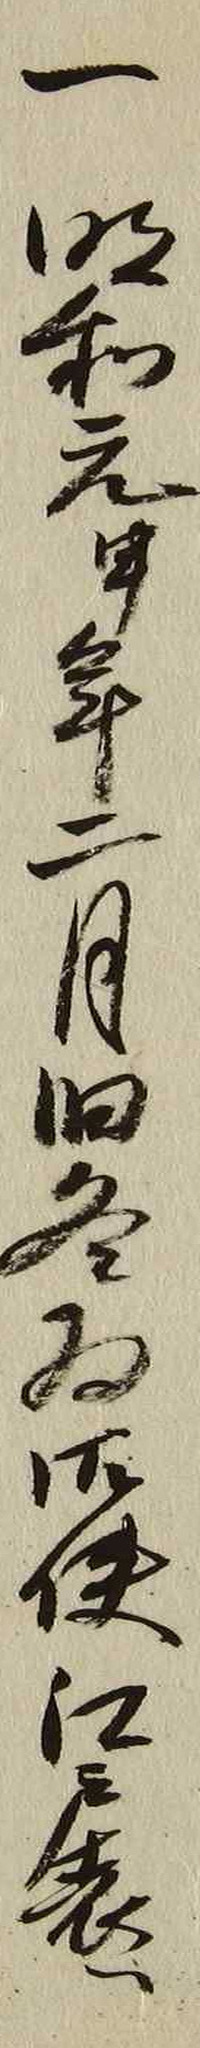一明和元申年二月旧冬為御使江戸表へ
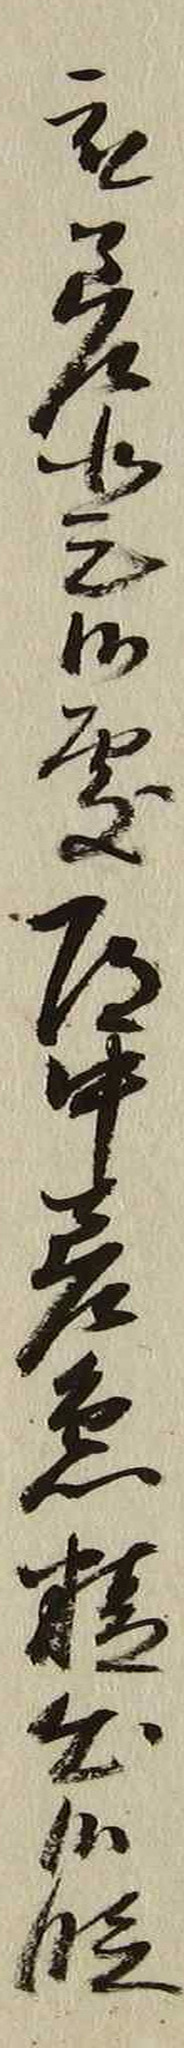被差登候処道中差急精出候段
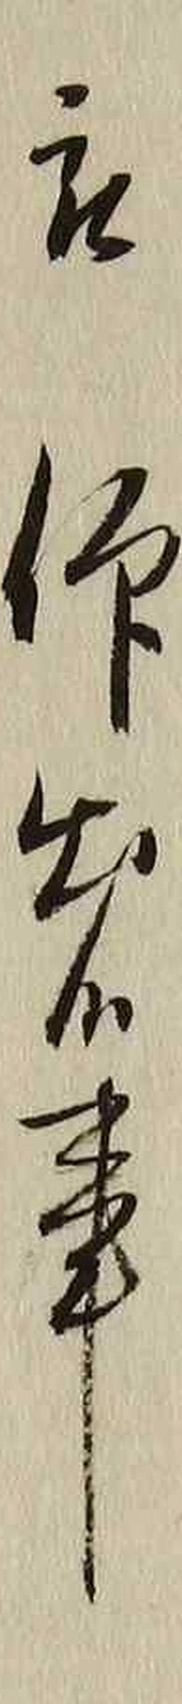被仰出候事
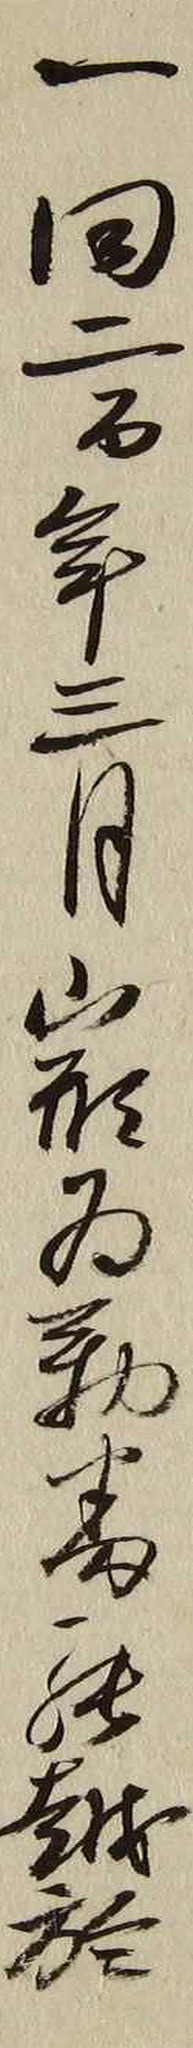一同二酉年三月山形為勤番罷越於
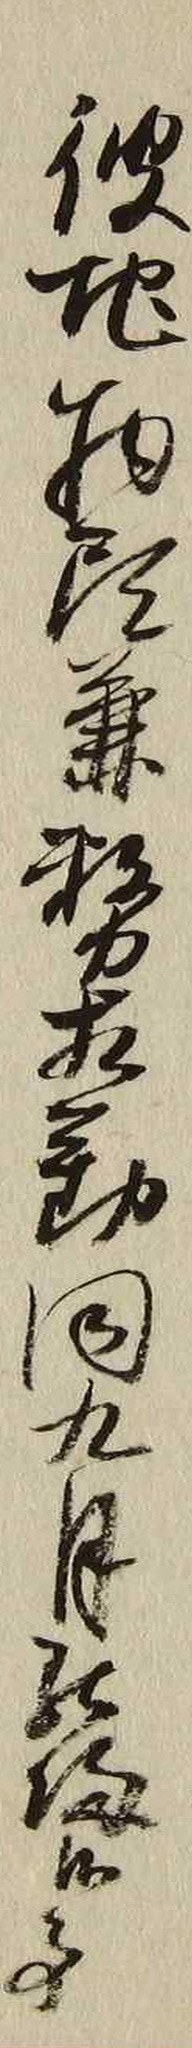彼地物頭兼務相勤同九月罷帰候事
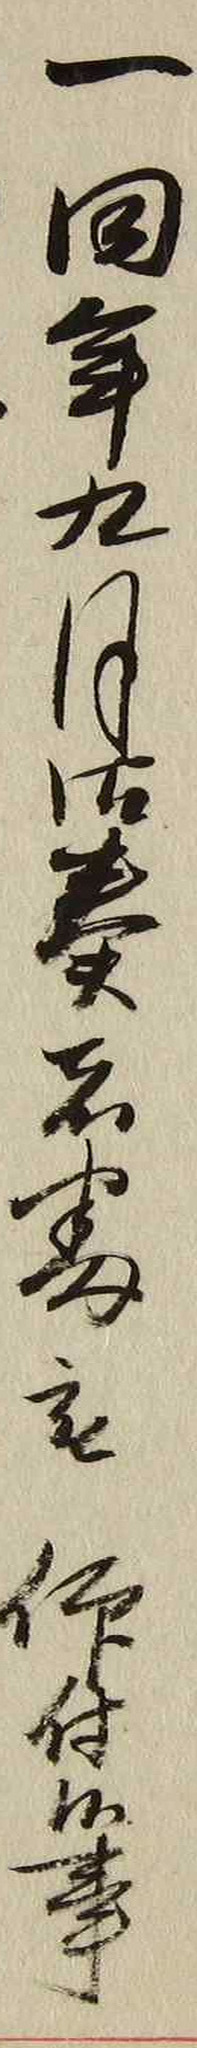一同年九月御奏者番被仰付候事
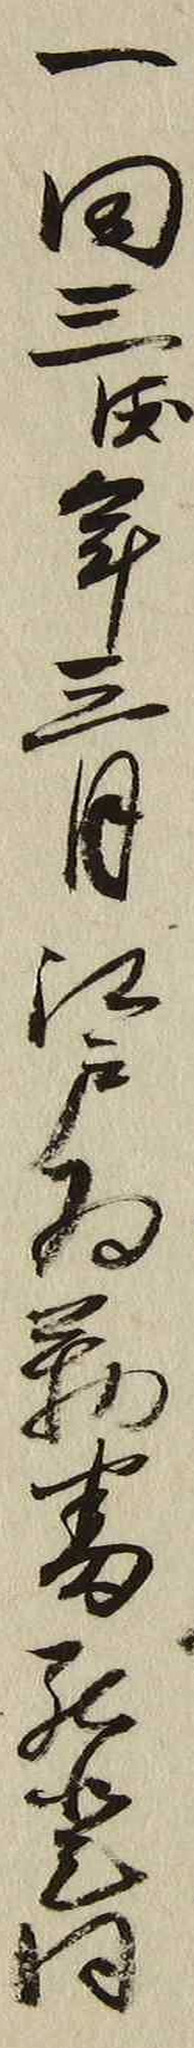一同三戌年三月江戸為勤番罷登同
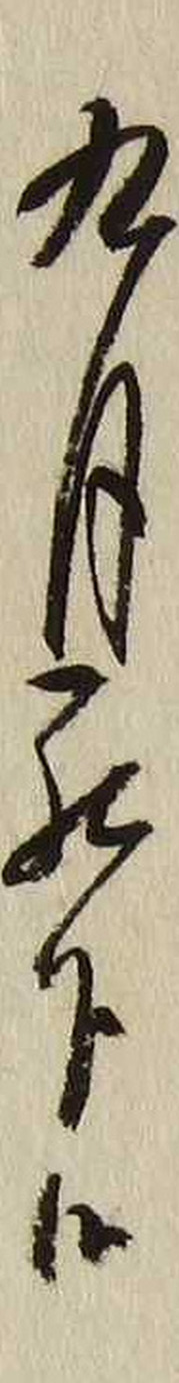九月罷下候
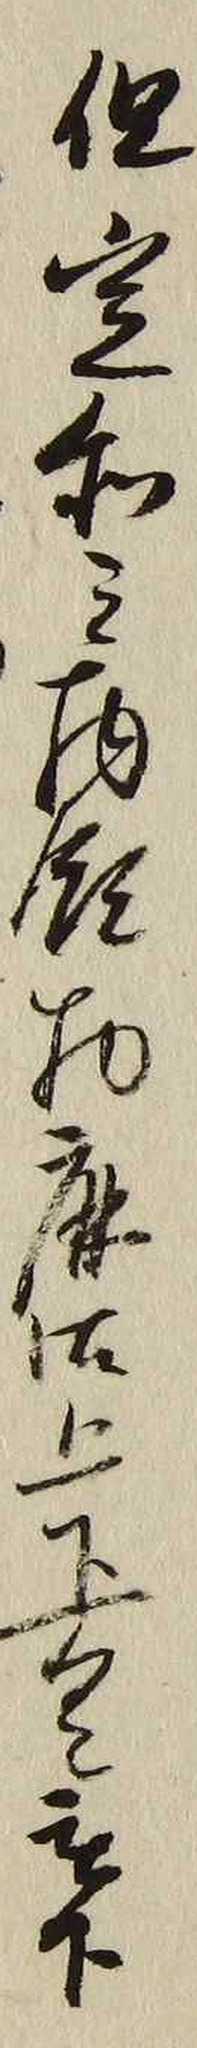但定和之拝領物麻御上下一具被下
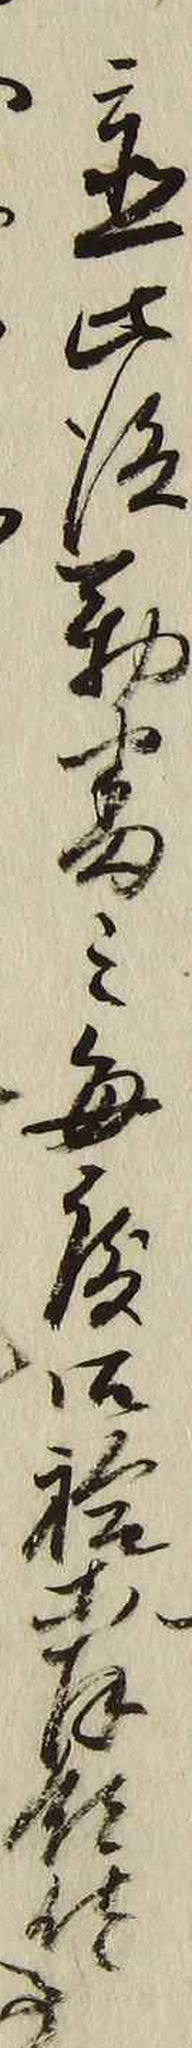置此後勤番之毎度御袷等拝領仕候事
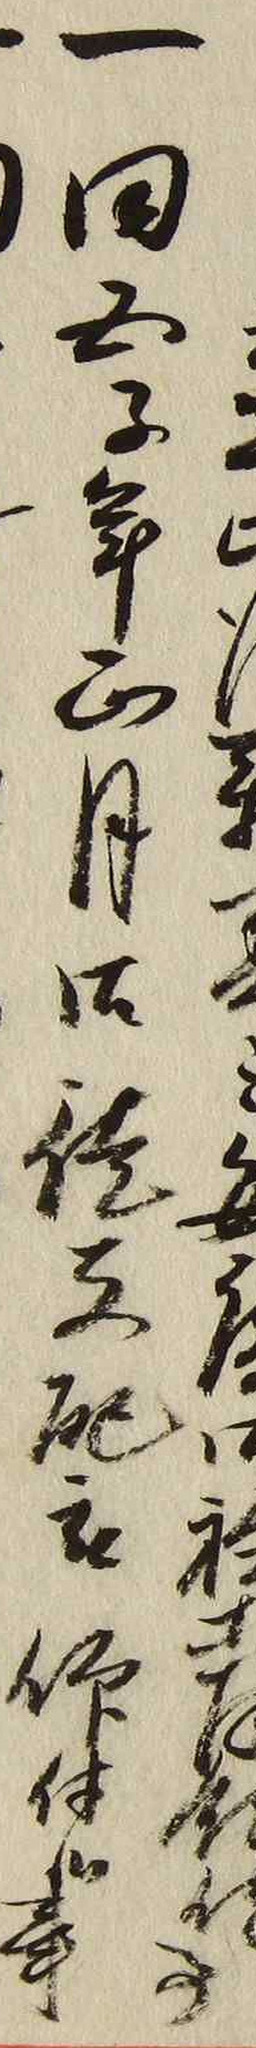一同五子年正月御徒支配被仰付候事
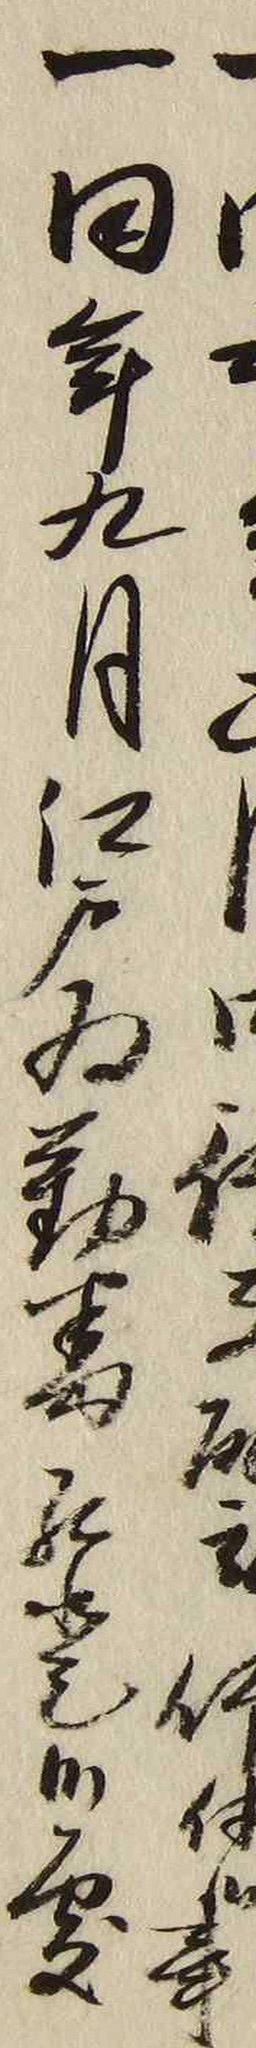一同年九月江戸為勤番罷登候処

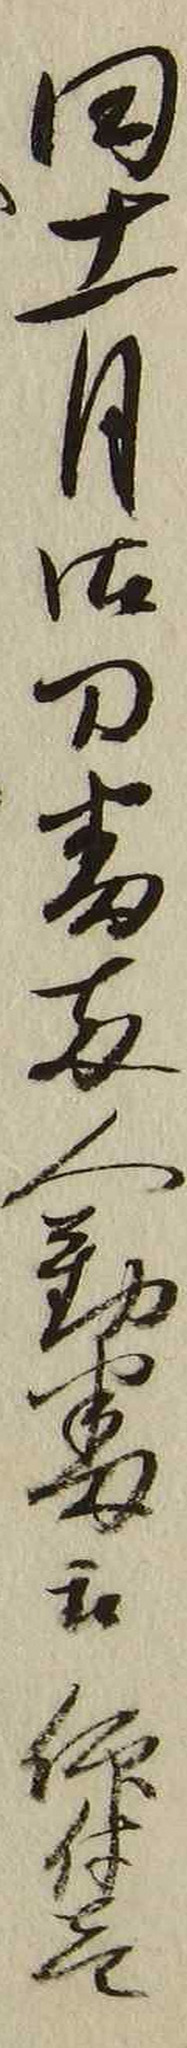同十一月御刀番両人勤番被仰付壱
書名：諸士系譜　巻之356　す之部6
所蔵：会津若松市立会津図書館
